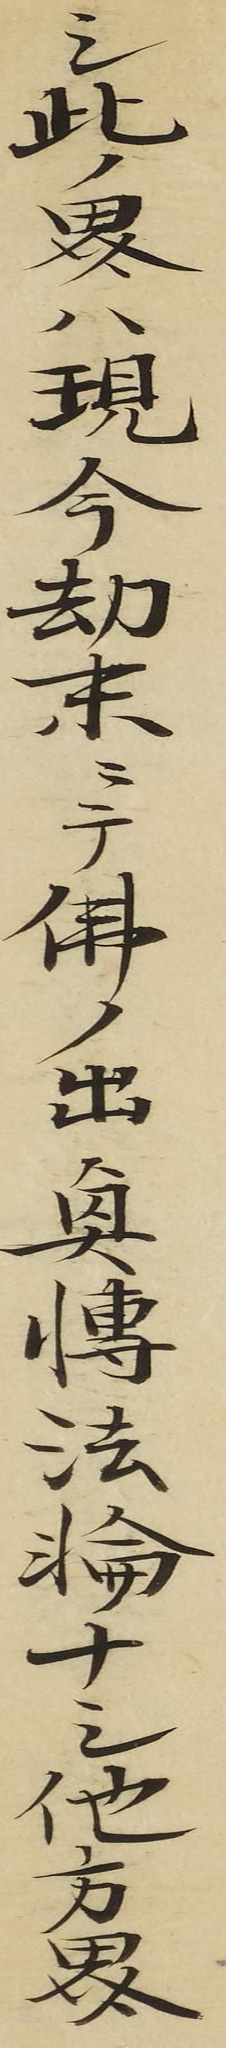シ此ノ界ハ現今刧末ニテ仏ノ出興転法論ナシ他方界
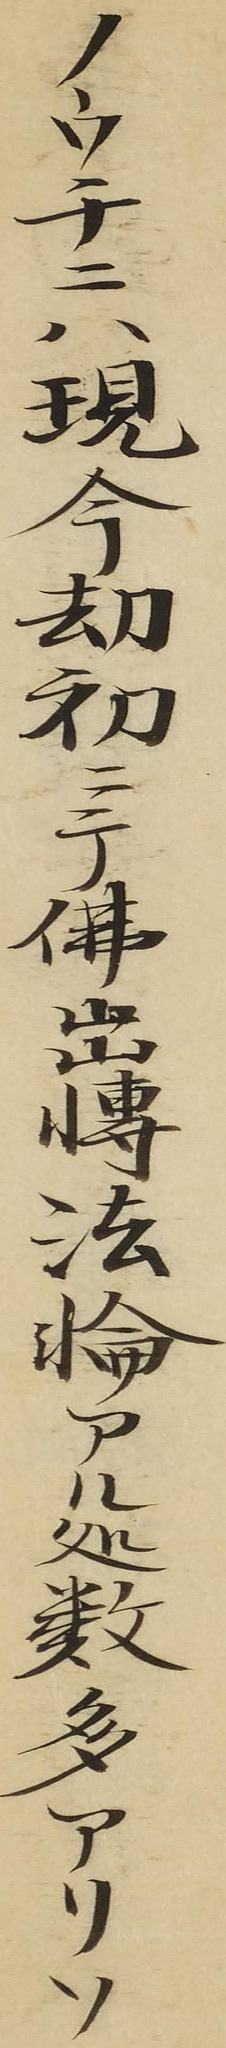ノウチニハ現今刧初ニテ仏出転法輪アル処数多アリソ
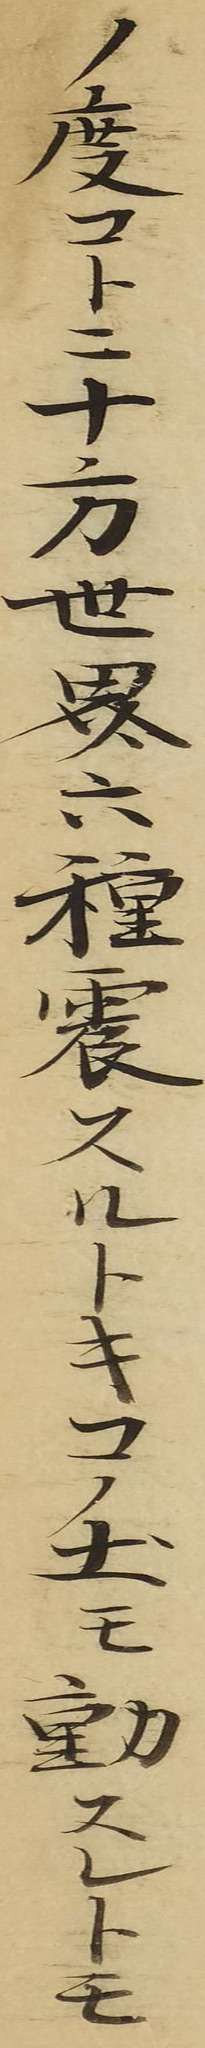ノ度コトニ十方世界六種震スルトキコノ土モ動スレトモ

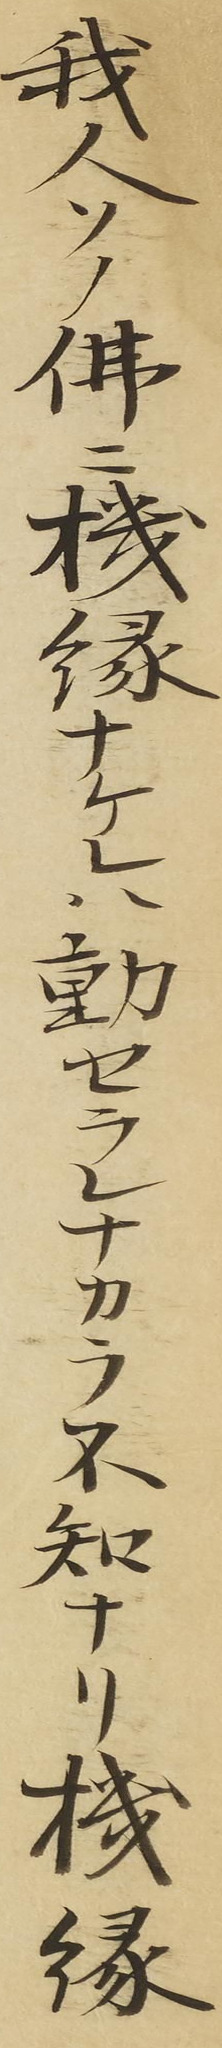我人ソノ仏ニ機縁ナケレハ動セラレナカラ不知ナリ機縁
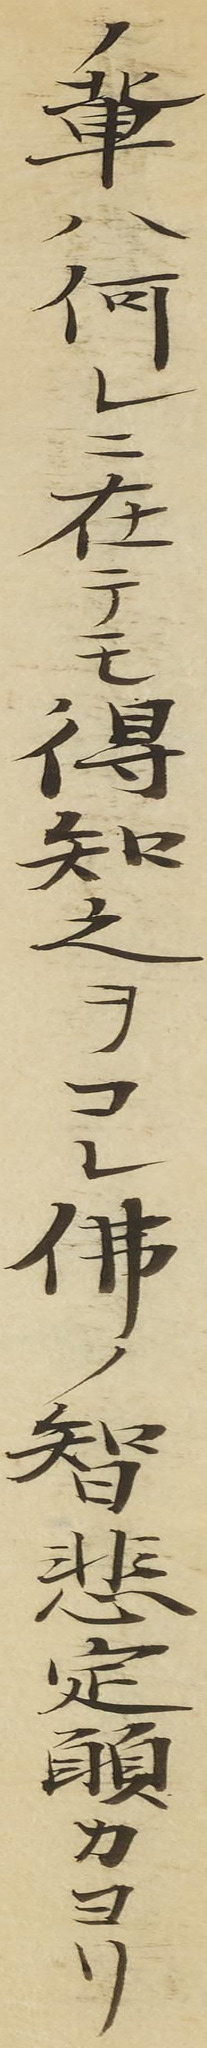ノ輩ハ何レニ在テモ得知之ヲコレ仏ノ智悲定願カヨリ
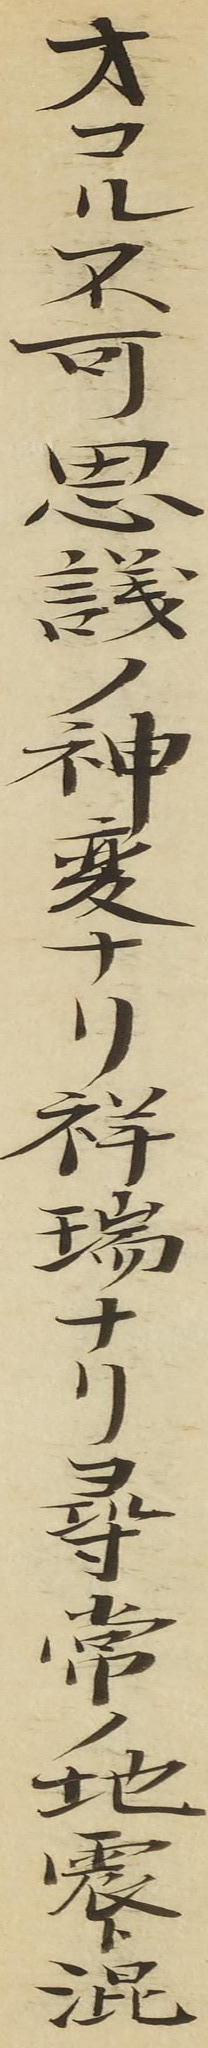オコル不可思議ノ神変ナリ祥瑞ナリ尋常ノ地震ト混
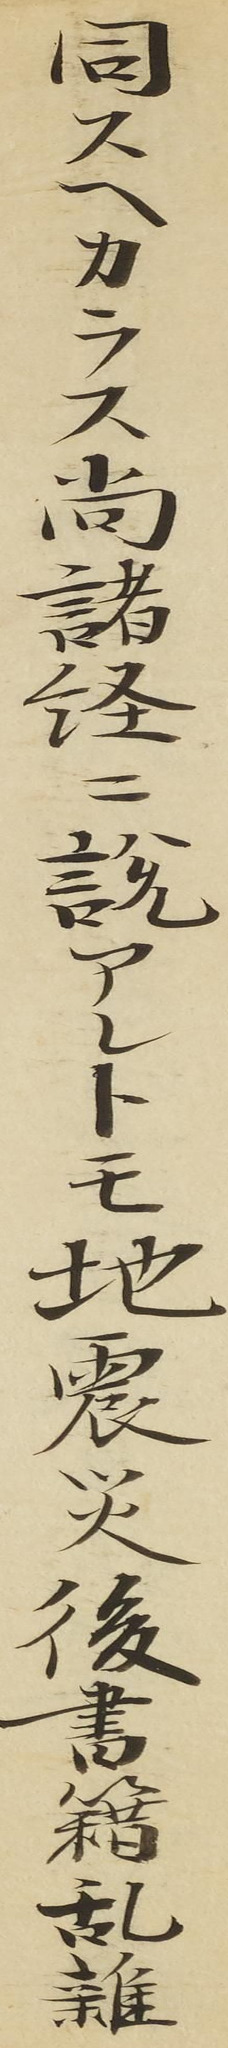同スヘカラス尚諸経ニ説アレトモ地震災後書籍乱雑
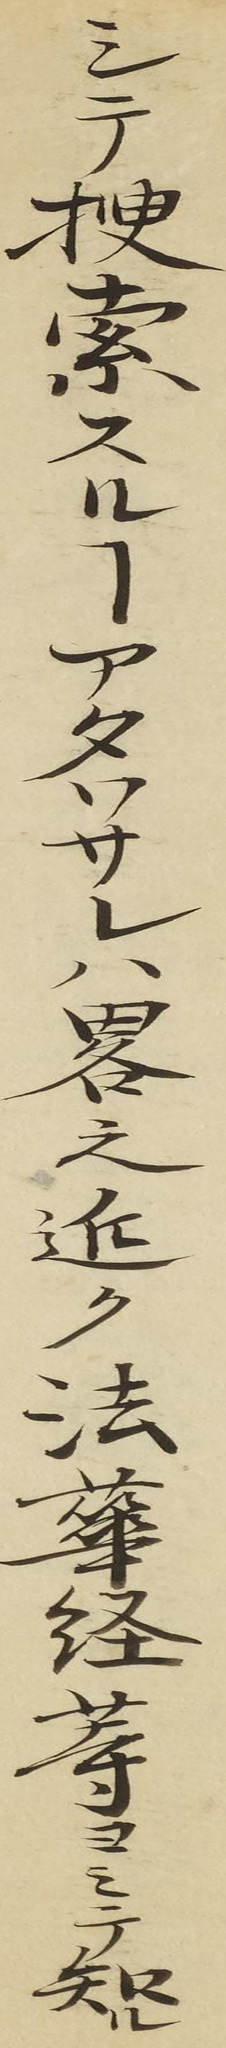シテ捜索スルコトアタワサレハ略之近ク法華経等ヨミテ知ル
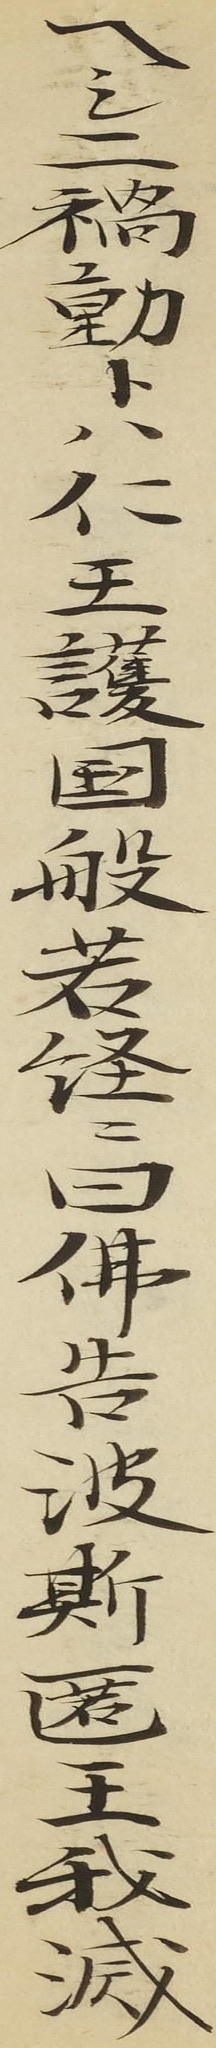ヘシニ禍動トハ仁王護国般若経ニ曰仏告波斯匿王我滅
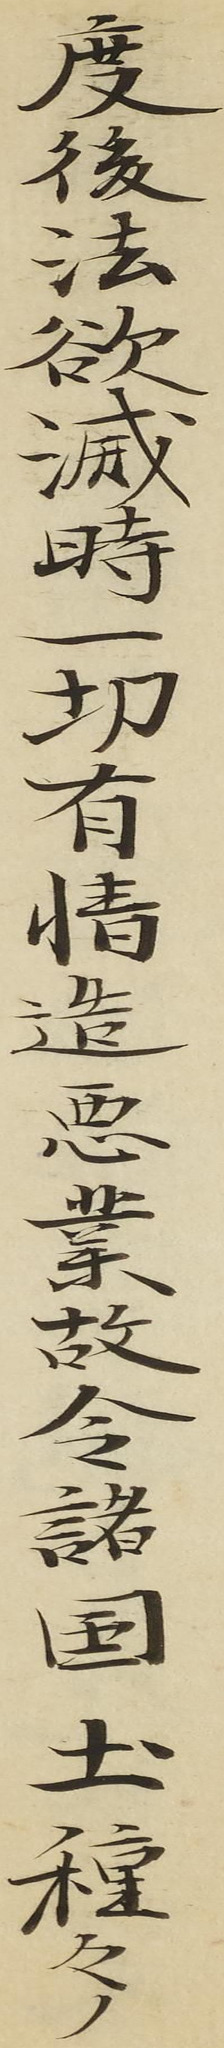度後法欲滅時一切有情造悪業故令諸国土種々ノ
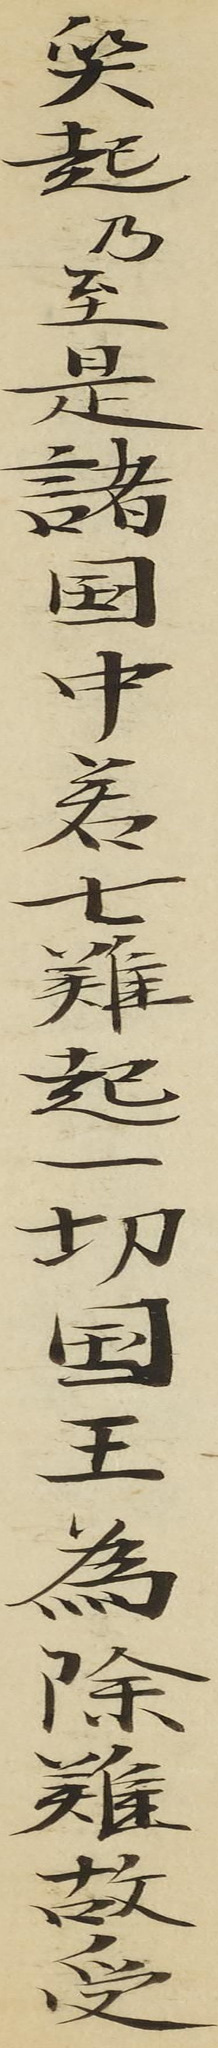災起乃至是諸国中若七難起一切国王為除難故受
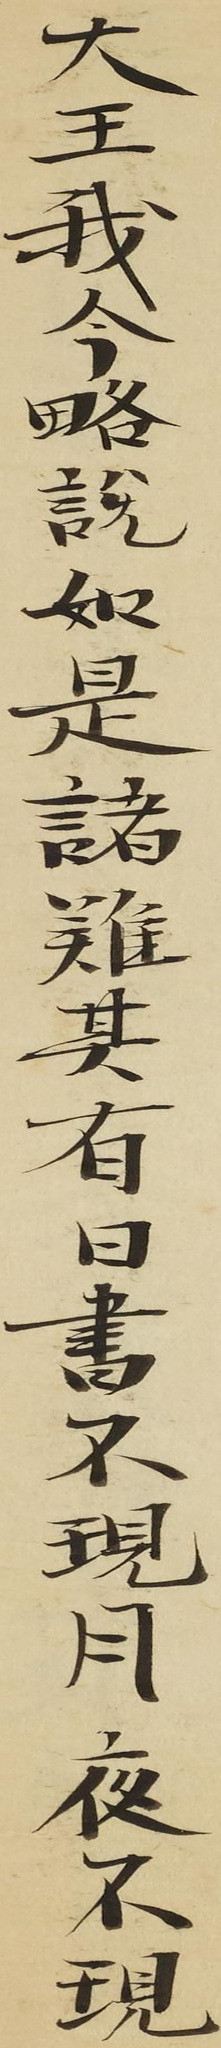大王我今略説如是諸難其有日書不現月夜不現
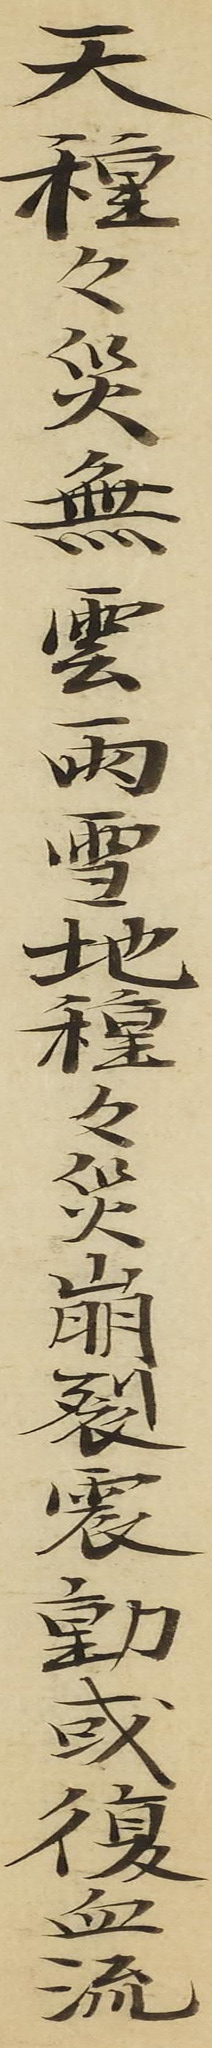天種々災無雲雨雪地種々災崩裂震動或復血流
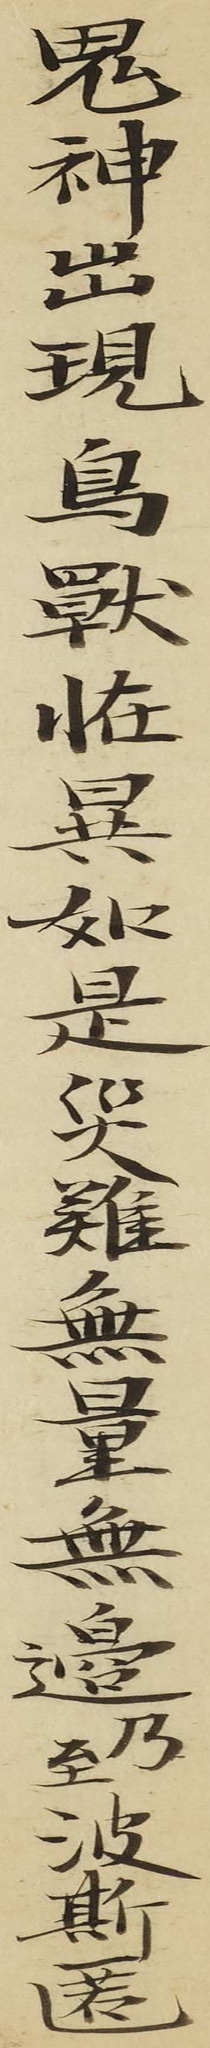鬼神出現鳥獣怪異如是災難無量無辺乃至波斯匿
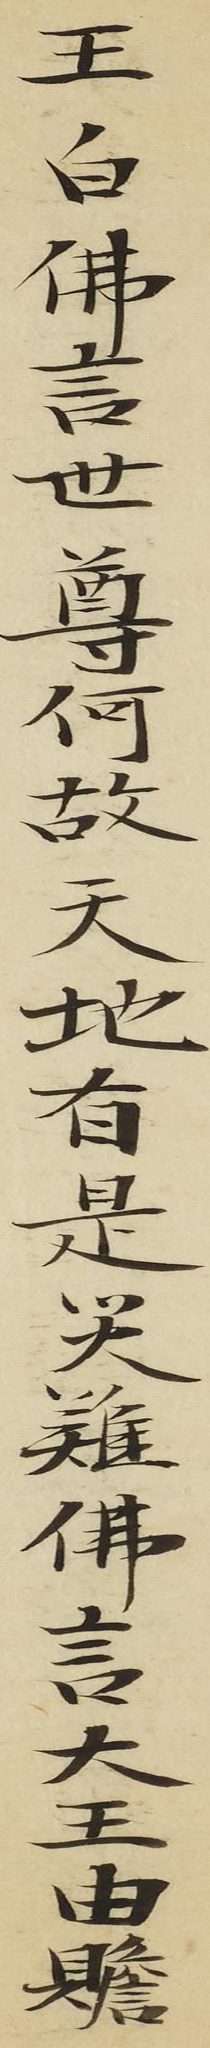王白仏言世尊何故天地有是災難仏言大王由贍
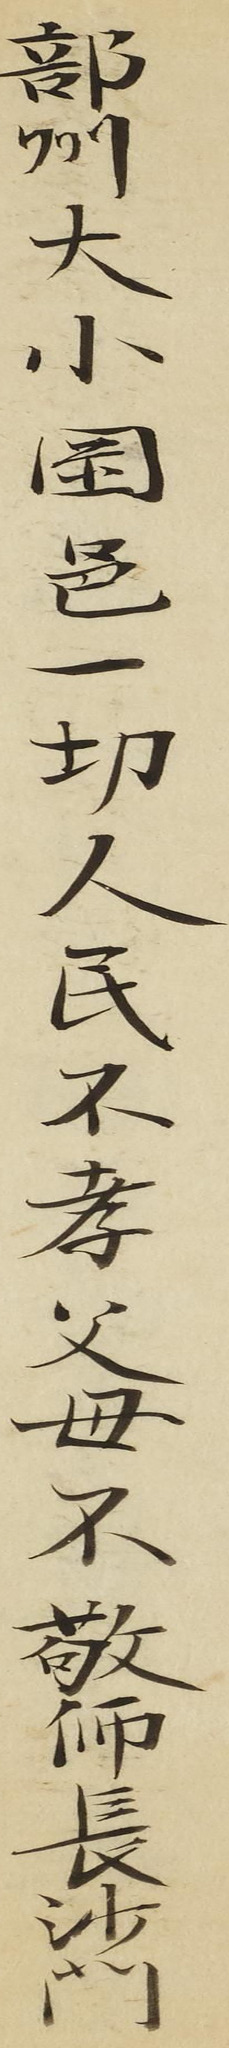部州大小園邑一切人民不孝父母不敬師長沙門
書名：地震説　鶴高山善仁寺天柗老人著述　全
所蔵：東京大学地震研究所図書室 Earthquake Research Institute Library, The University of Tokyo, JAPAN
